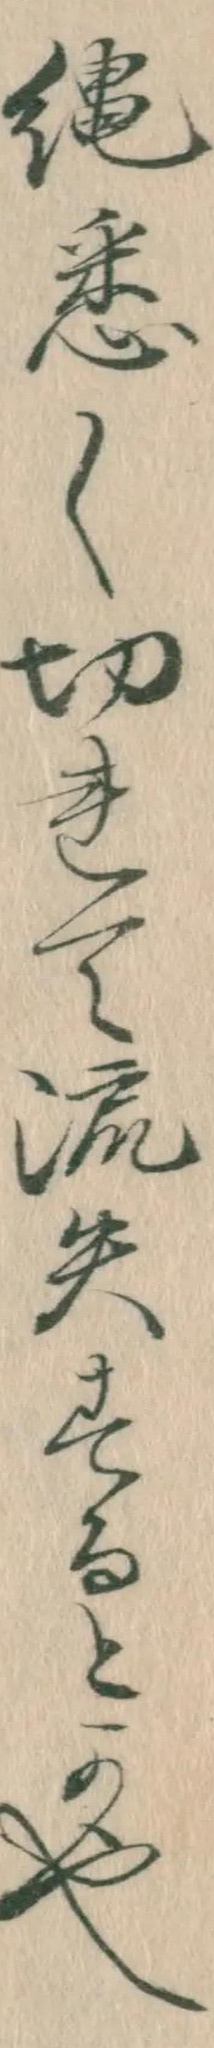縄悉く切れて流失するとかや
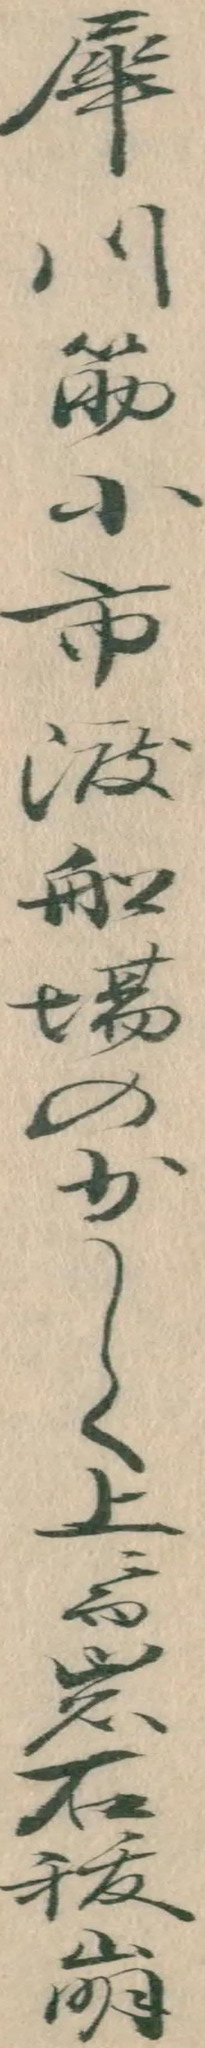犀川筋小市渡船場の少しく上ニ而岩石抜崩
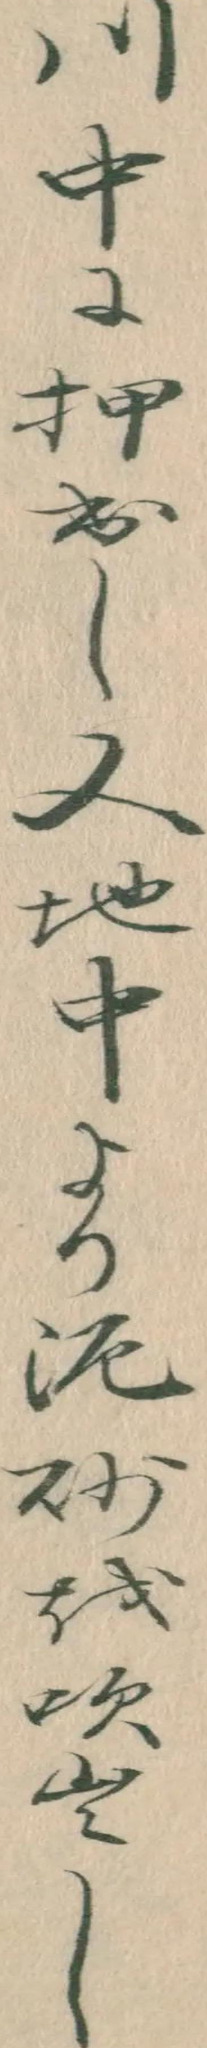川中に押出し又地中より泥砂を吹出し
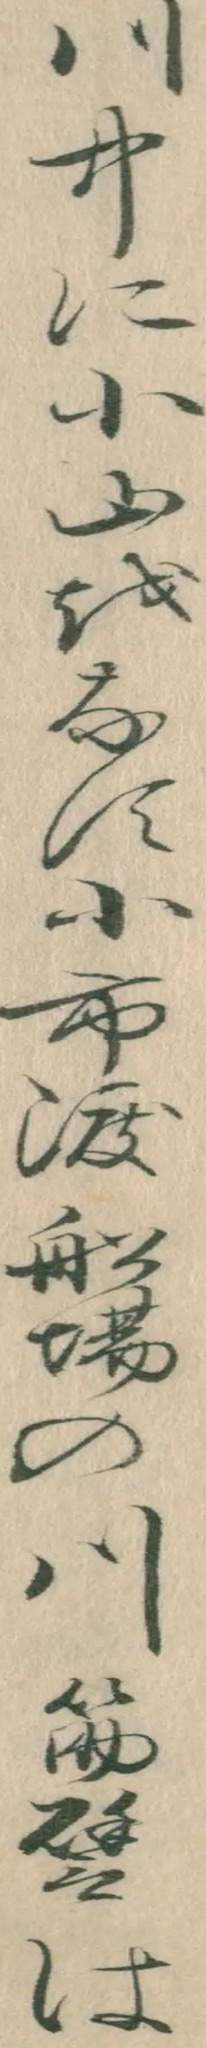川中に小山をなす小市渡船場の川筋譬は

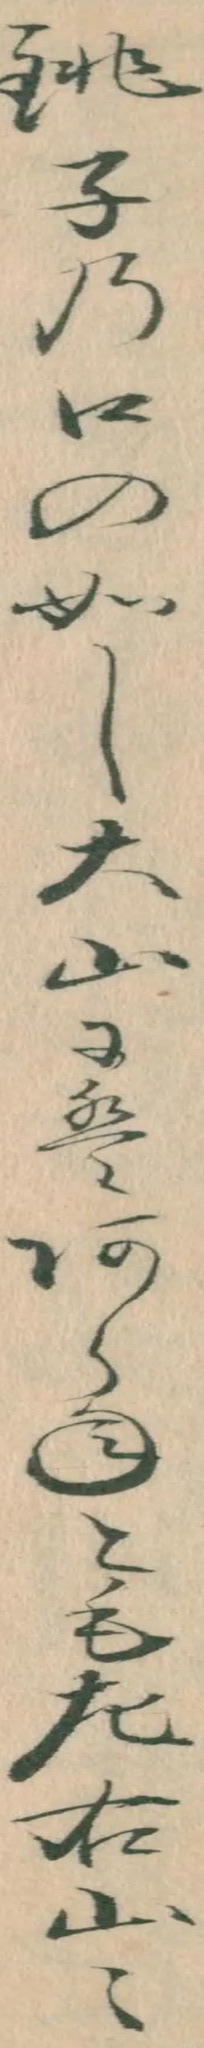銚子の口の如し大山にはあらねとも左右山〻
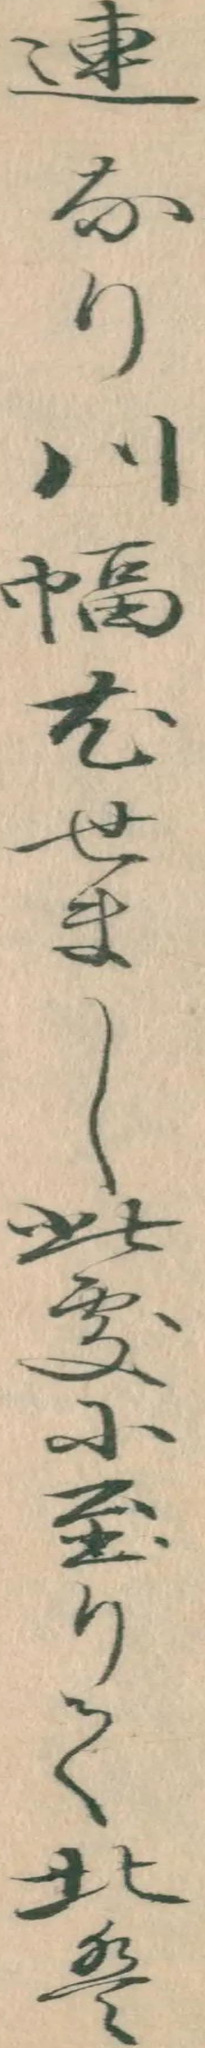連なり川幅尤せまし此処に至りて北は
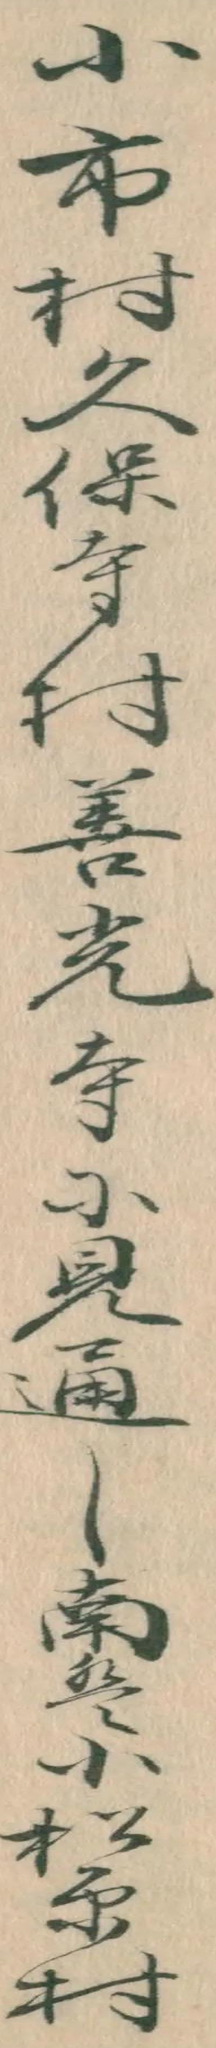小市村久保寺村善光寺に見通し南は小松原村
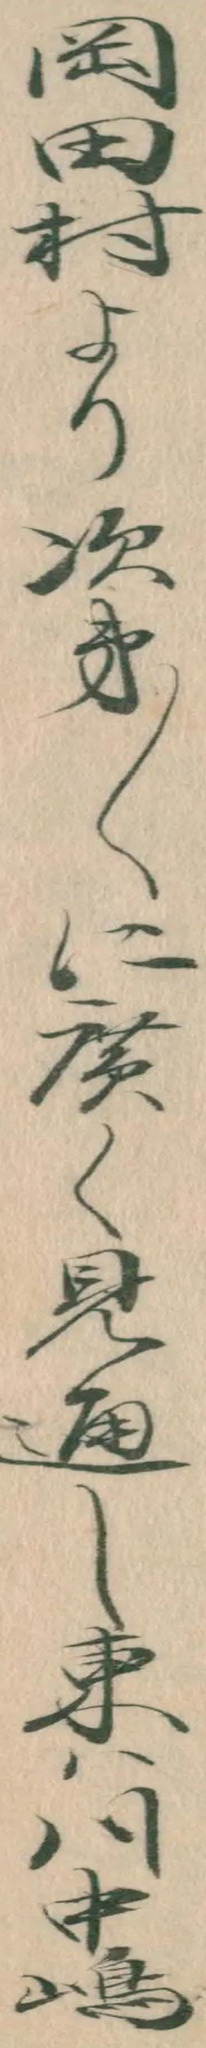岡田村より次第〳〵に広く見通し東は川中嶋
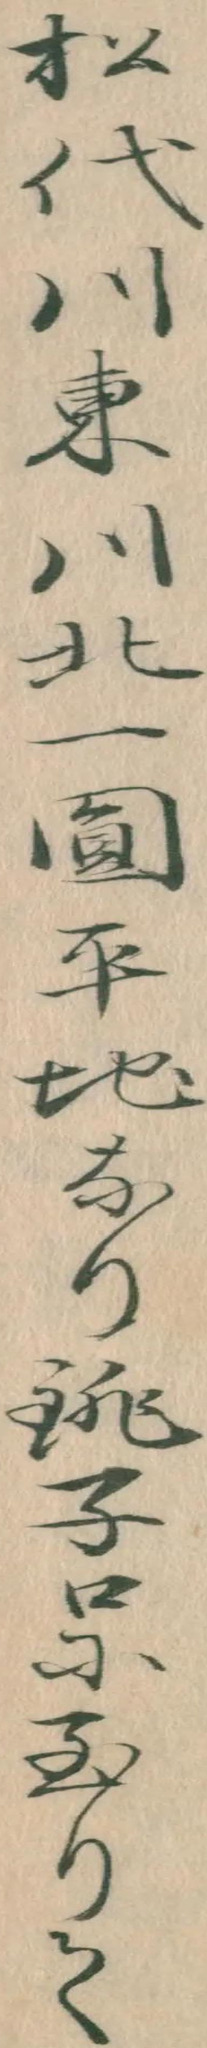松代川東川北一面平地なり銚子口に至りて
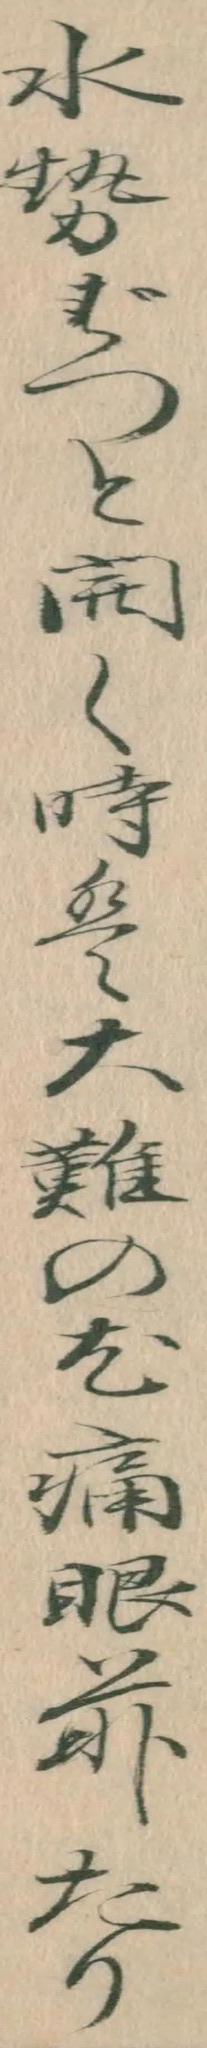水勢ばつと開く時は大難の尤痛眼前たり
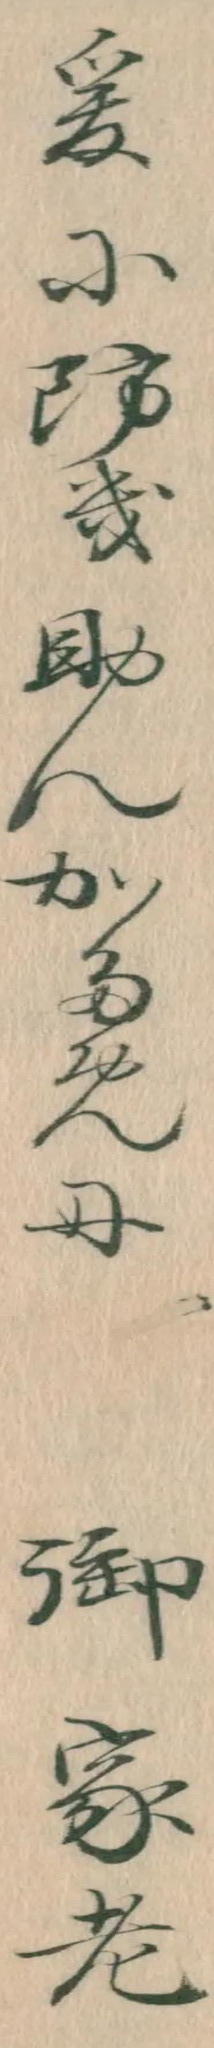爰に防き助んかために御家老
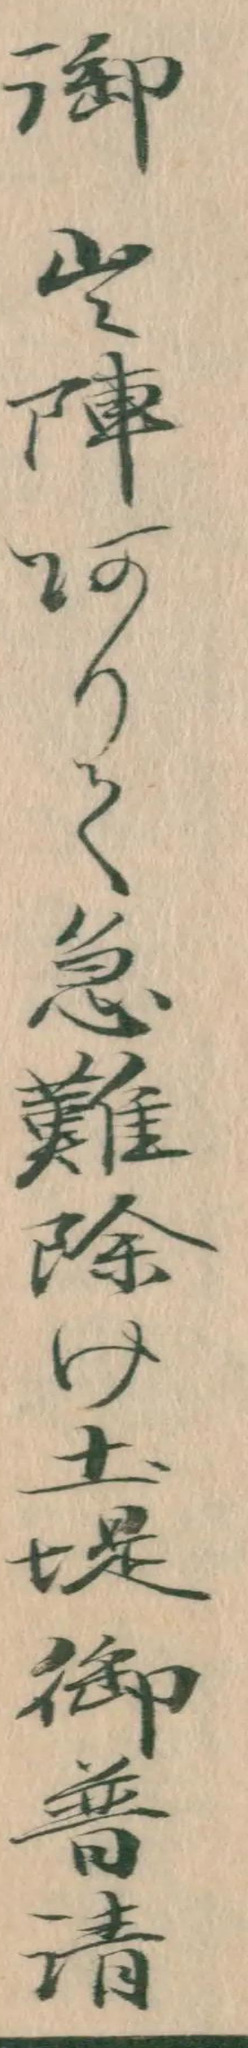御出陣ありて急難除け土堤御普請
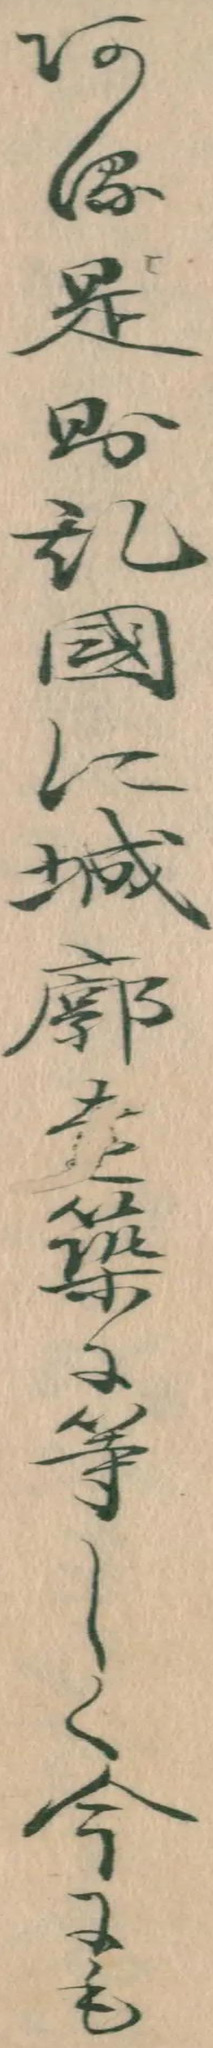ある是則乱国に城廓を築に等しく今にも
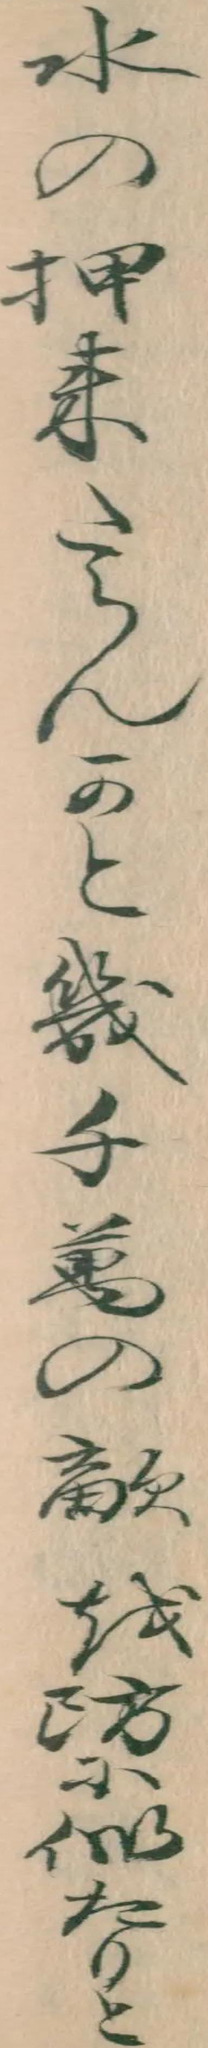水の押来たらんかと幾千万の敵を防に似たりと
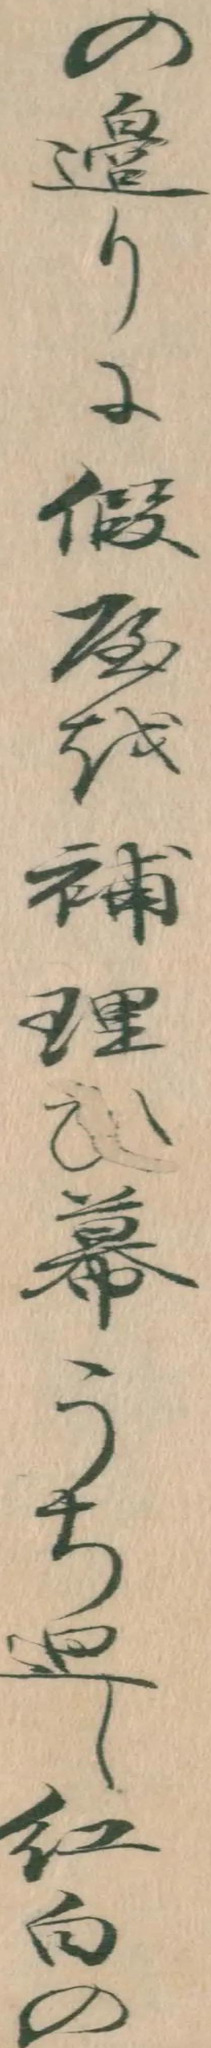の辺りに假屋を補理ひ幕うち廻し紅白の
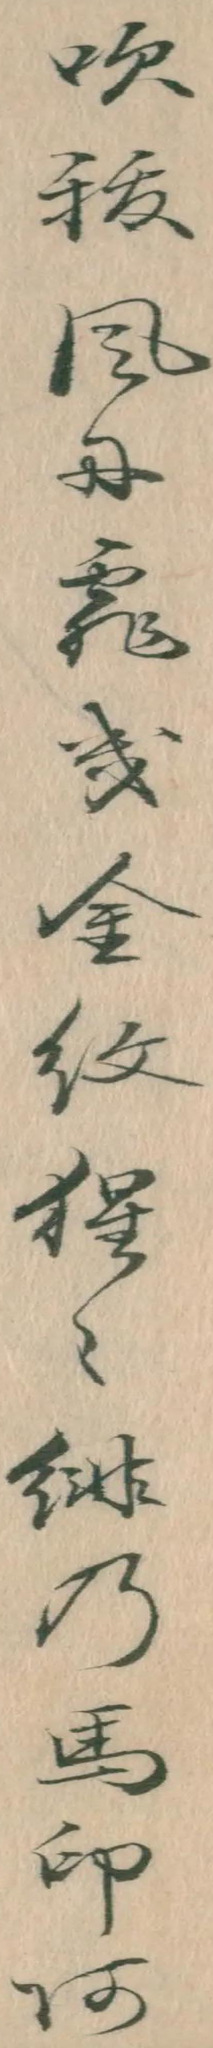吹抜風に霏？き金紋猩々緋の馬印あ
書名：俗語之種. [6]
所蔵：国立国会図書館 National Diet Library, JAPAN
